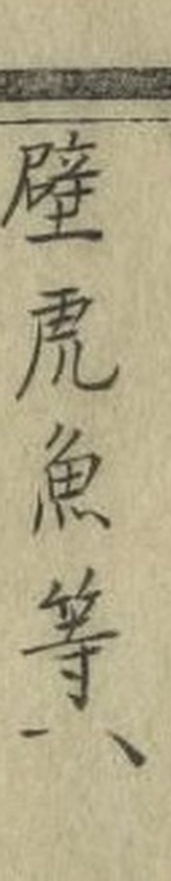壁虎魚等、

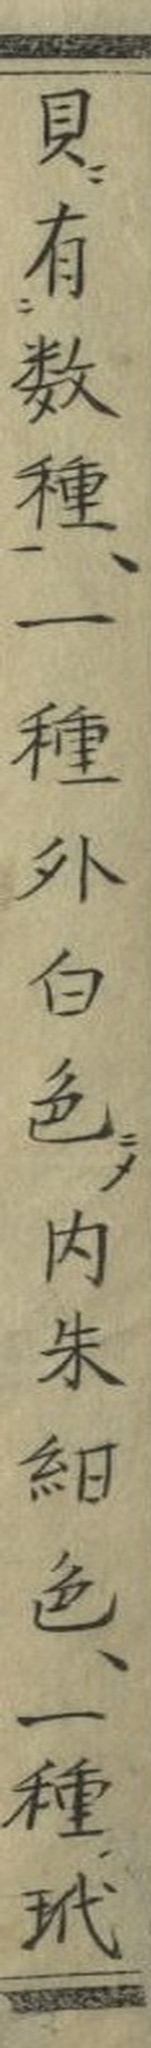貝有数種、一種外白色内朱𥿀色、一種玳

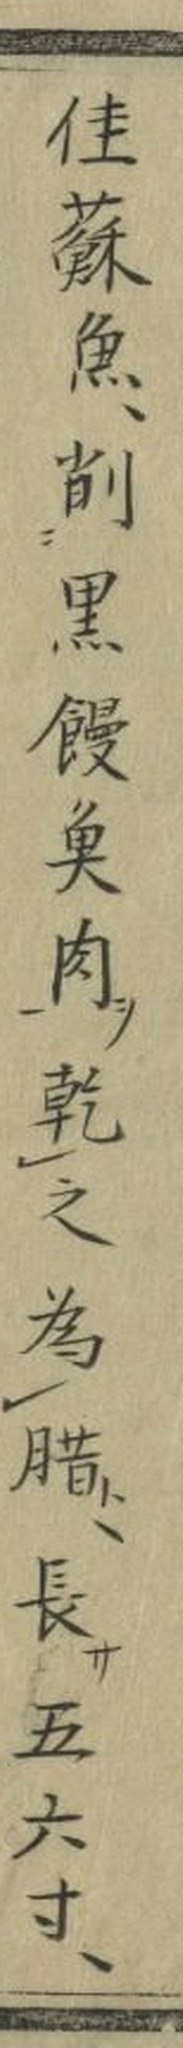佳蘇魚、削黒饅𩵋肉、乾之為腊、長五六寸、

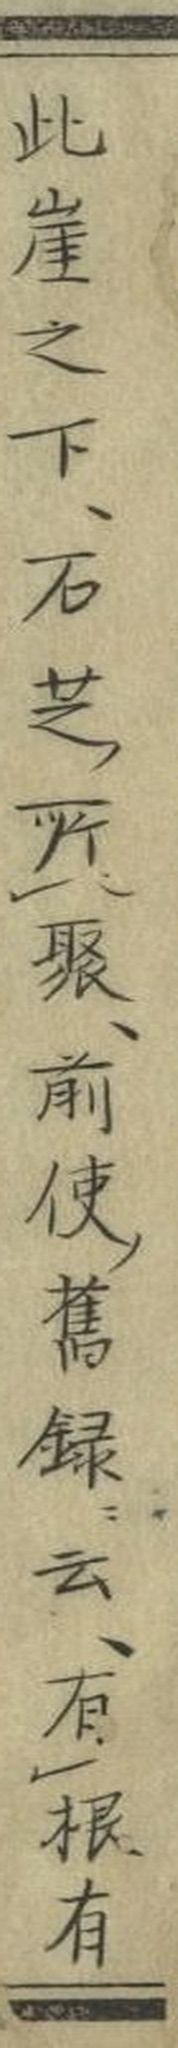此崖之下、石芝所也聚前使舊録云、有根有

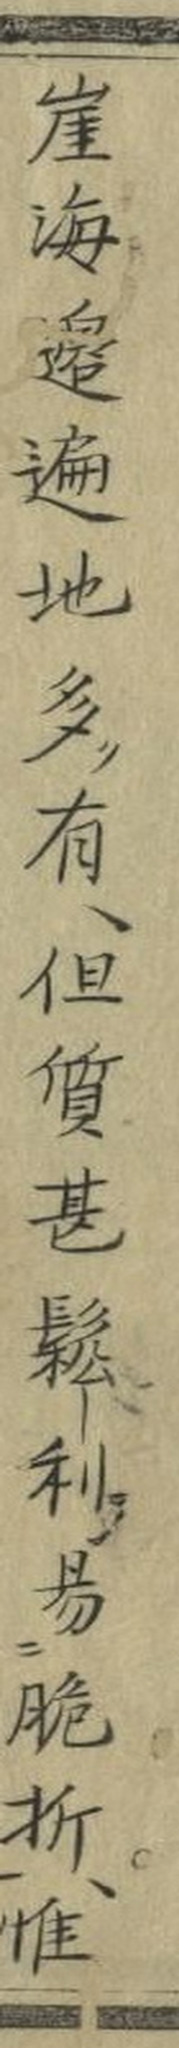崖海邉遍地多有、但質甚鬆利昜脆折、惟
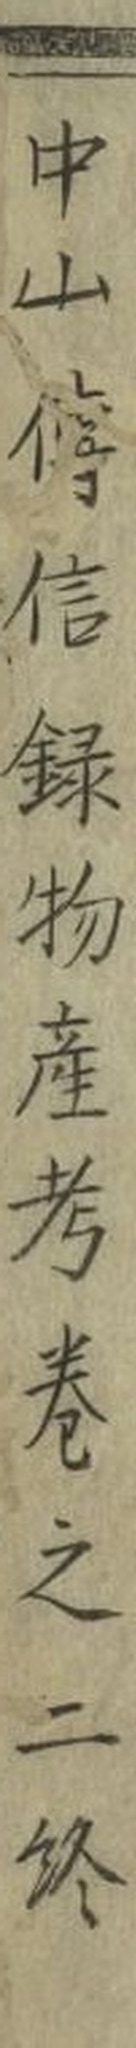中山伝傳録物産考巻之二終
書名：中山伝信録物産考 地
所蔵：University of the Ryukyus Library
